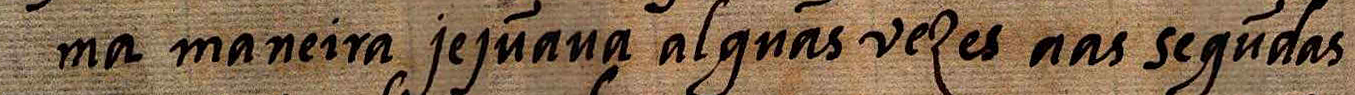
ma maneira jejūaua alguās vezes aas segūdas
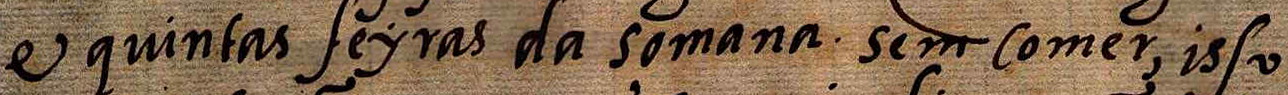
e quintas feyras da somana sem comer, isso
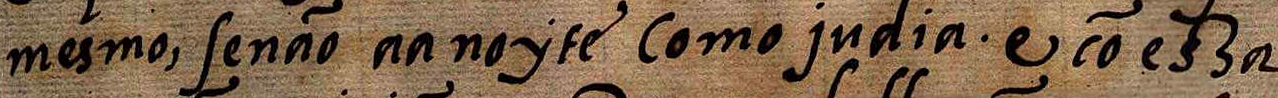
mesmo, senão aa noyte como judia. e cō essa
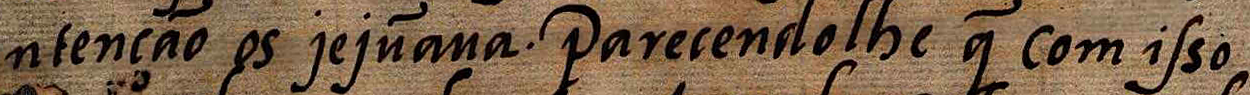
jntençaõ os jejūaua. Parecendo lhe q̄ com isso
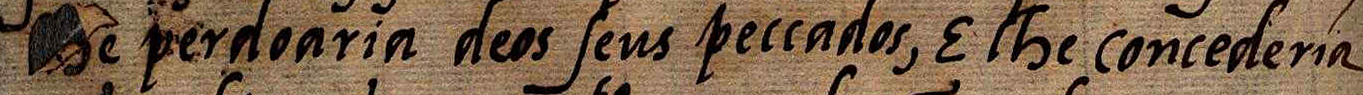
lhe perdoaria deos seus peccados, E lhe concederia
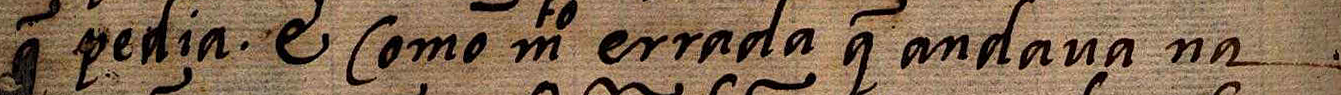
o q̄ pedia. E Como mto errada q̄ andaua na
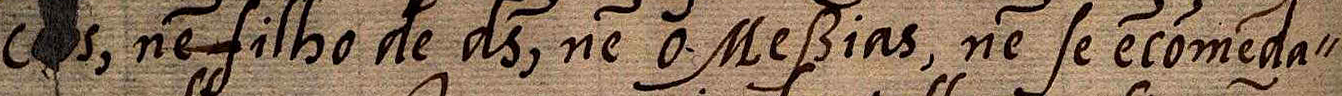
ceos, nē filho de ds̄, nē o Messias, nē se ēcōmēda
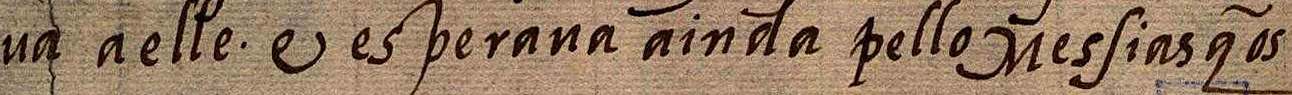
ua a elle. e esperaua ainda pello Messias q̄ os
